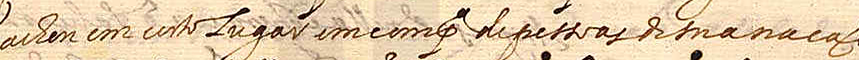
achou em certo Lugar em compa de pessoas de sua nacaõ
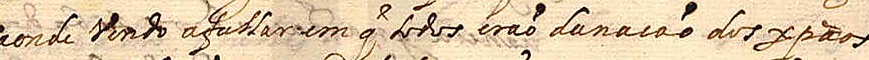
aonde Vindo a fallar em q̄ todos eraõ da nacaõ dos xpãos
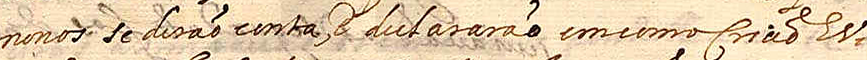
nouos se deraõ conta, & declararaõ em como Criaõ E Vi
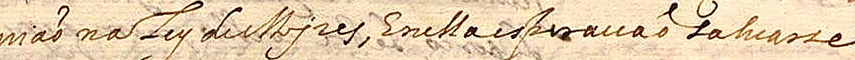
uiaõ na Ley de Mojzes, E nella esperauaõ saluarse
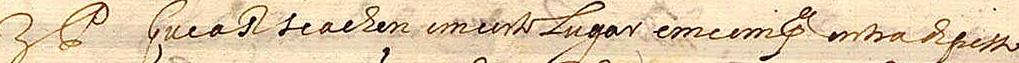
3 P Que a R se achou em certo Lugar em compa outra de pesso
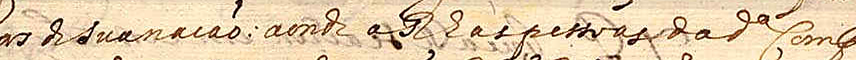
as de sua nacaõ : aonde a R E as pessoas da da Compa
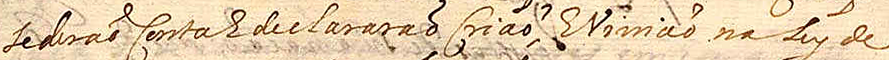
se deraõ Conta E declararaõ Criaõ, E Viuiaõ na Ley de
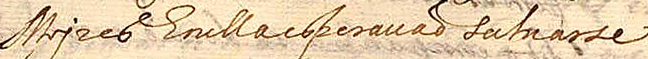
Mojzes E nella esperauaõ saluarse
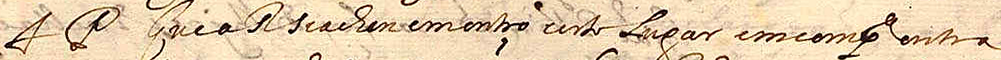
4 P Que a R se achou em outro certo Lugar em compa outra
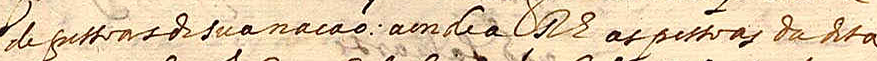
de pessoas de sua nacaõ : aonde a R E as pessoas da dita
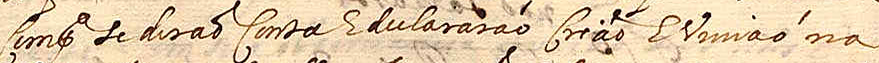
Compa se deraõ Conta E declararaõ Criaõ E Viuiaõ na
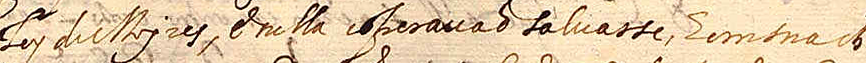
Ley de Mojzes, & nella esperauaõ saluarse, E em sua ob
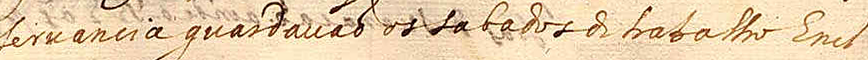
seruancia guardauaõ os sabados de trabalho E nel
